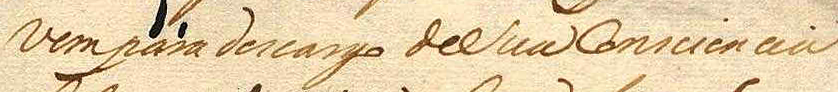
vem para descargo de sua Consciencia
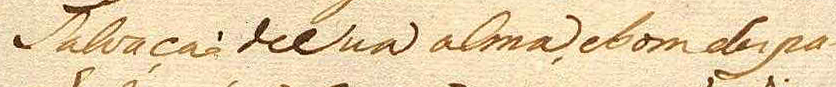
salvaçaõ de sua alma, e bom despa
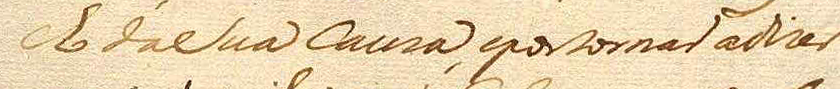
cho da sua cauza, e por tornar a dizer
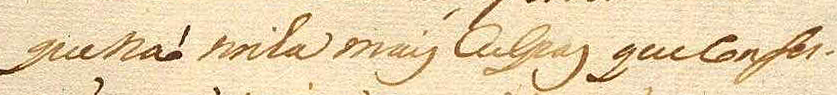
que naõ tinha mais Culpas que confes
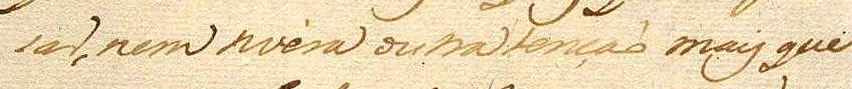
sar, nem tivera outra tençaõ mais que
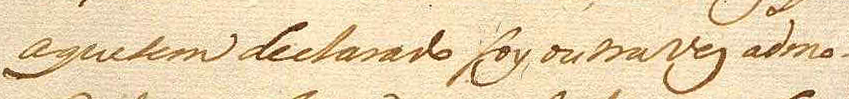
a que tem declarado foy outra vez admo
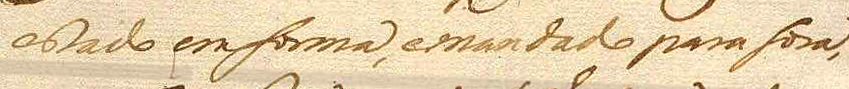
estado em forma, e mandado para fora,
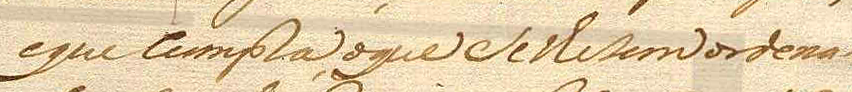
e que cumpra o que se lhe tem ordena
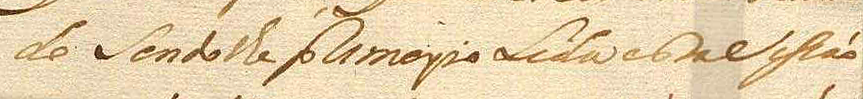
do sendolhe primeyro Lida esta sessaõ
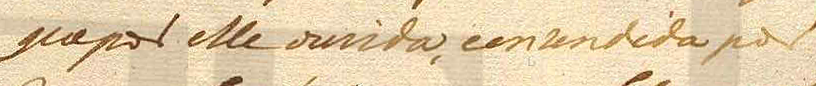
que por elle ouvida, e entendida por
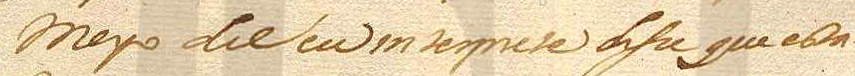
meyo de seu interprete disse que esta
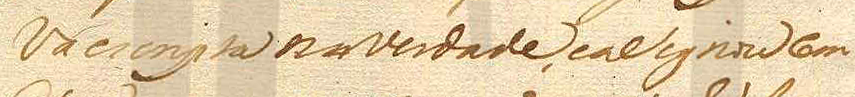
va escripta na verdade, e asignou com
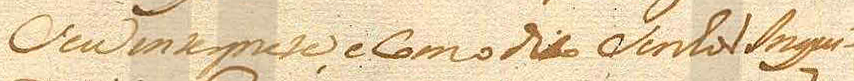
seu interprete, e com o dito senhor Inqui
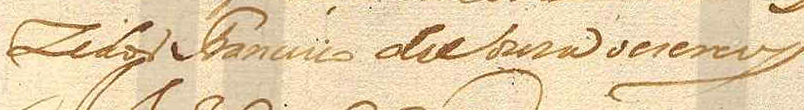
Zidor Francisco de Souza o escrevj
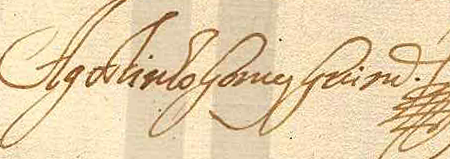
Agostinho Gomes Guim.es
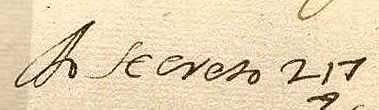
Ao secreto 217
